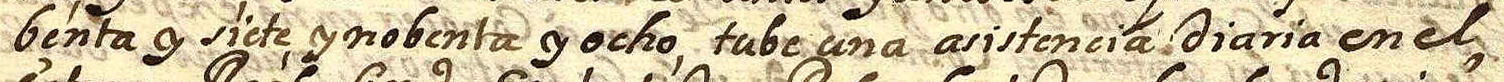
benta y siete, y nobenta y ocho, tube una asistencia diaria en el
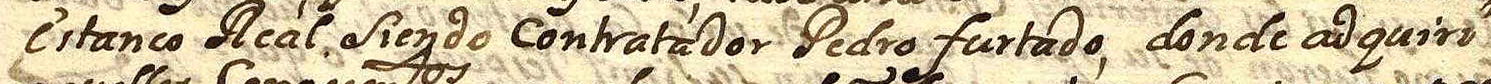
estanco Real siendo contratador Pedro furtado, donde adquiri
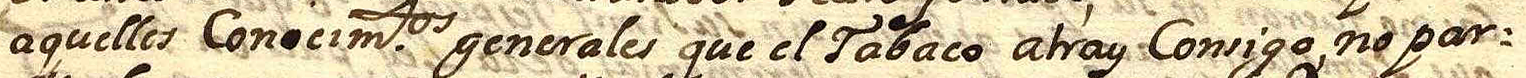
aquelles Conocim.tos generales que el Tabaco atray Consigo, no par
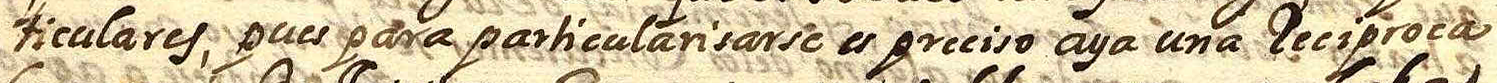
ticulares, pues para particularisarse es preciso aya una Reciproca
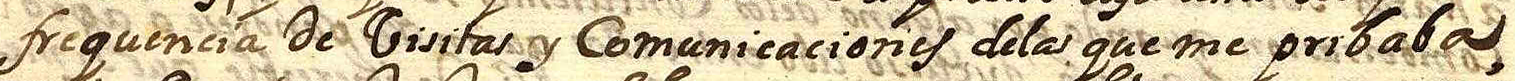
frequencia de Visitas y Comunicaciones delas que me pribaba
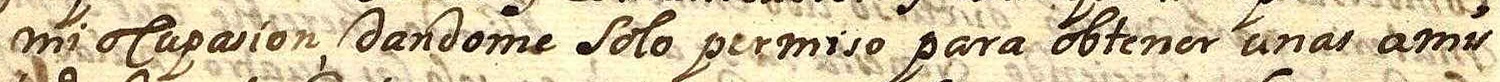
mi oCupasion, dandome solo permiso para obtener unas amis
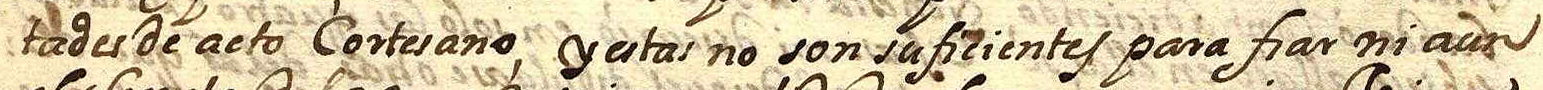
tades de acto Cortesano, y estas no son suficientes para fiar ni aun
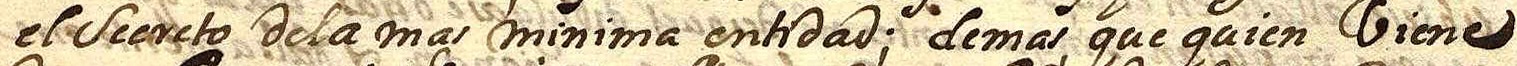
el Secreto dela mas minima entidad; demas que quien Viene
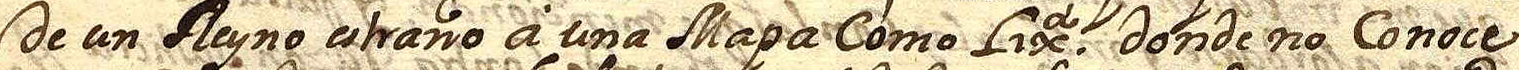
de un Reyno estraño à una Mapa Como Lix.a; donde no Conoce
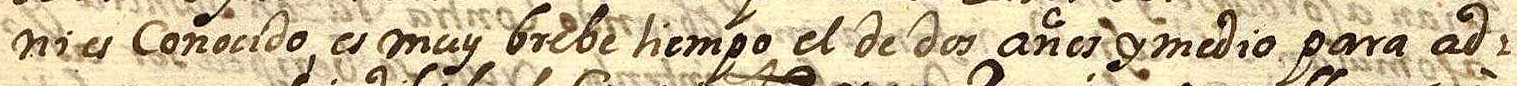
ni es conocido, es muy brebe tiempo el de dos años y medio para ad
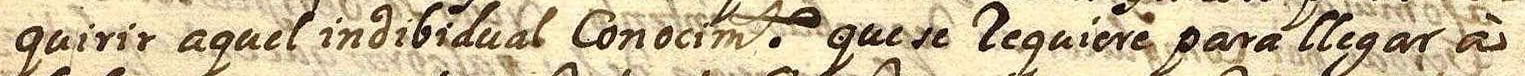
quirir aquel indibidual Conocim.to que se Requiere para llegar à
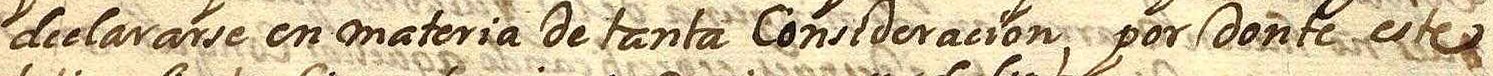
declararse en materia de tanta Consideracion, por donte este
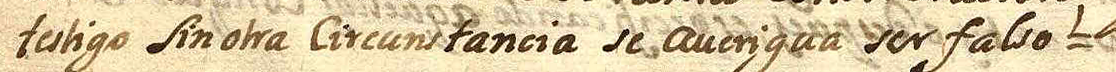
testigo sin otra Circunstancia se auerigua ser falso
